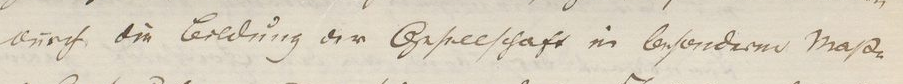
durch die Bildung der Gesellschaft in besonderm Maße
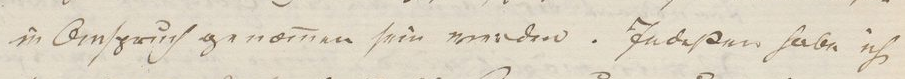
in Anspruch genommen sein werden. Indeßen habe ich
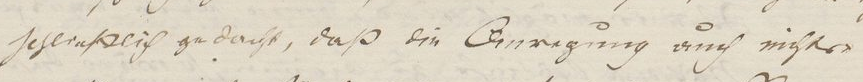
schließlich gedacht, daß die Anregung auch nichts
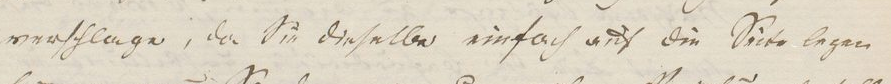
verschlage, da Sie dieselbe einfach auf die Seite legen
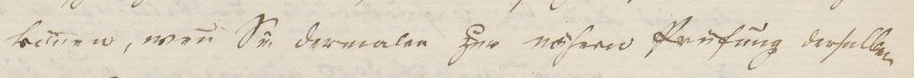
können, wenn Sie dermalen zur nähern Prüfung derselben
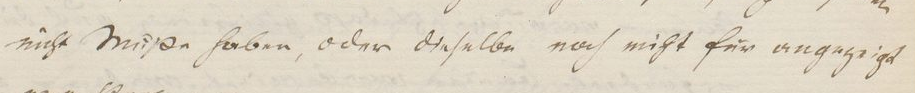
nicht Muße haben, oder dieselbe noch nicht für angezeigt
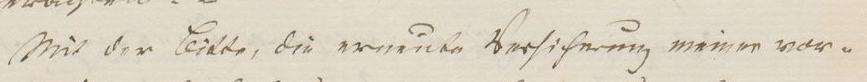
Mit der Bitte, die erneute Versicherung meiner vor-
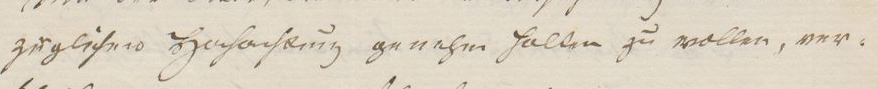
züglichen Hochachtung genehm halten zu wollen, ver-
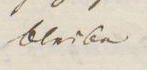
bleibe
